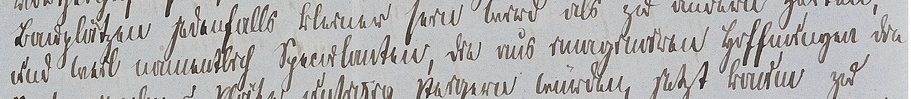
und weil namentlich Speculanten, die aus imaginären Hoffnungen die
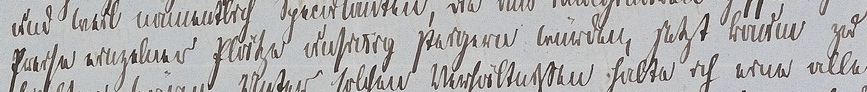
Preise einzelner Plätze unsinnig steigern würden, jetzt kaum zu
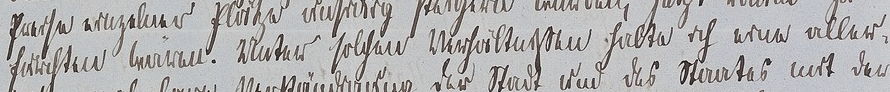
fürchten wären. Unter solchen Verhältnissen halte ich eine aller-
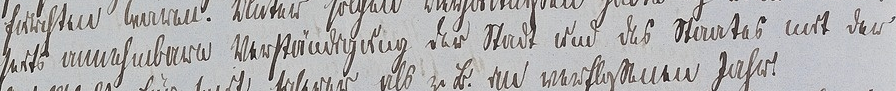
seits annehmbare Verständigung der Stadt und des Staates mit der
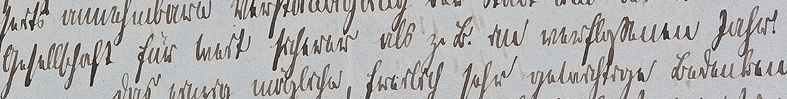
Gesellschaft für weit sicherer als z. B. im verflossenen Jahr.
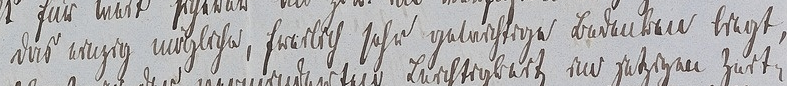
Das einzig mögliche, freilich sehr gewichtige Bedenken liegt,
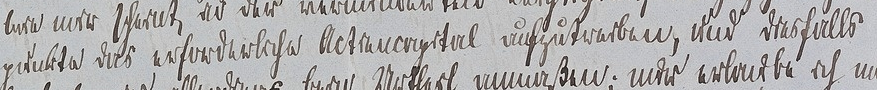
punkte das erforderliche Actiencapital aufzutreiben, und diesfalls
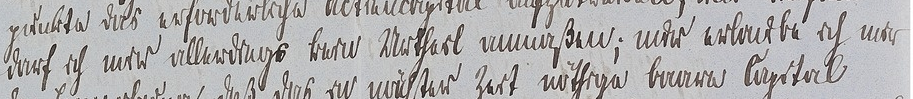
darf ich mir allerdings kein Urtheil anmaßen; nur erlaube ich mir
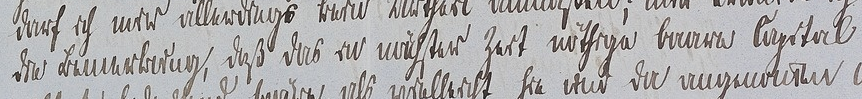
die Bemerkung, daß das in nächster Zeit nöthige baare Capital
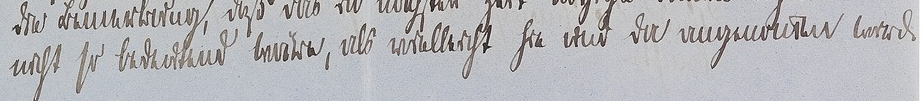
nicht so bedeutend wäre, als vielleicht hie und da angenommen wird.
